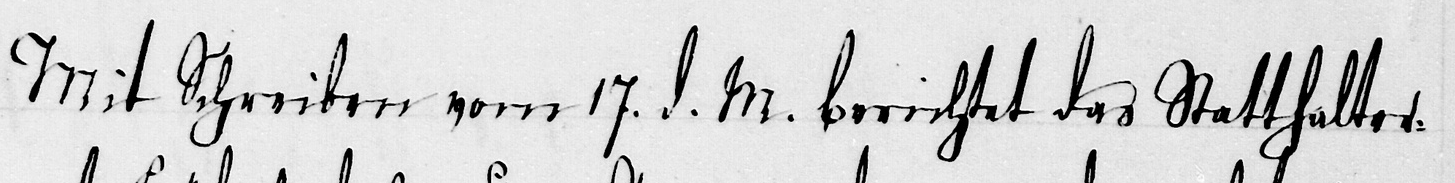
Mit Schreiben vom 17. d. M. berichtet das Statthalter¬
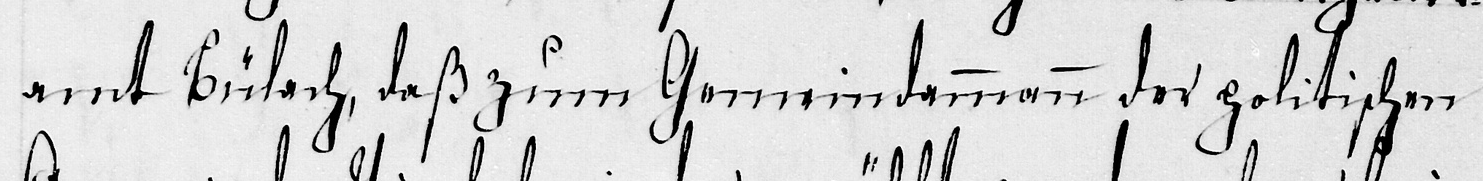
amt Bülach, daß zum Gemeindammann der politischen
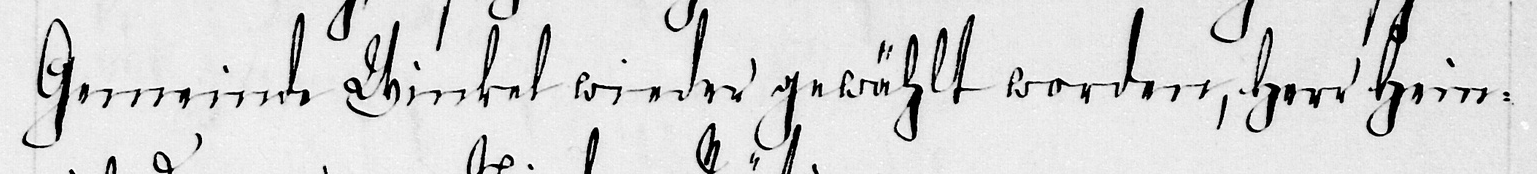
Gemeinde Winkel wieder gewählt worden, Herr Hein¬
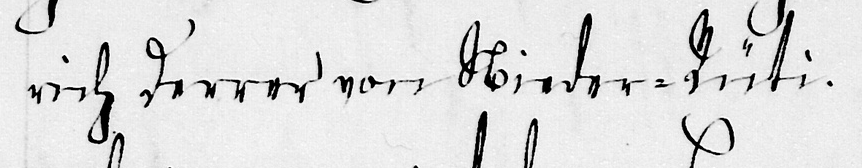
rich Derrer von Nieder-Rüti.
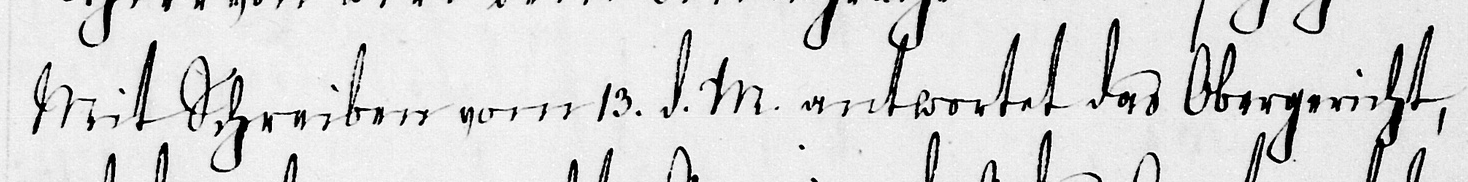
Mit Schreiben vom 13. d. M. antwortet das Obergericht,
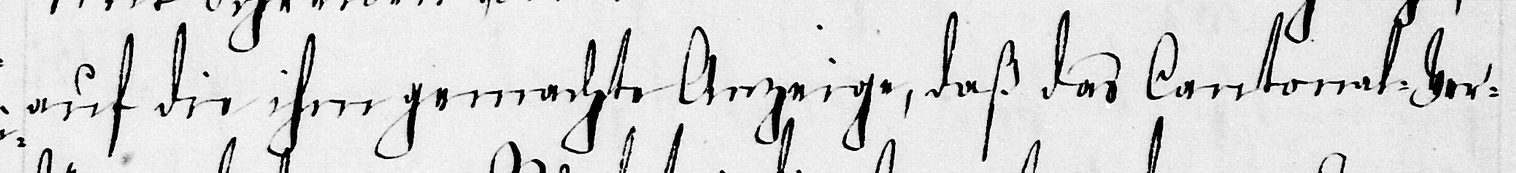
auf die ihm gemachte Anzeige, daß das Cantonal-Ver¬
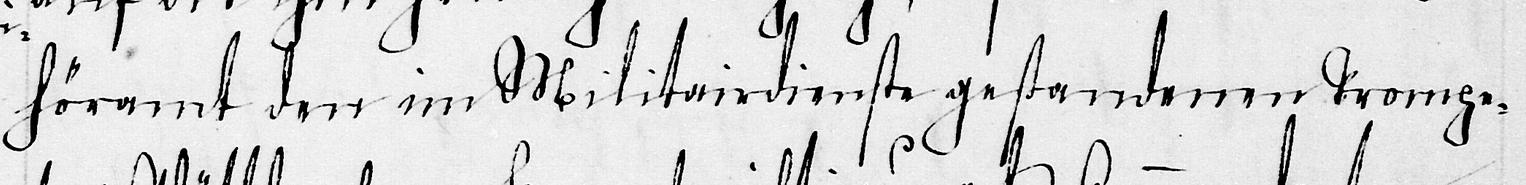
höramt den im Militairdienste gestandenen Trompe¬
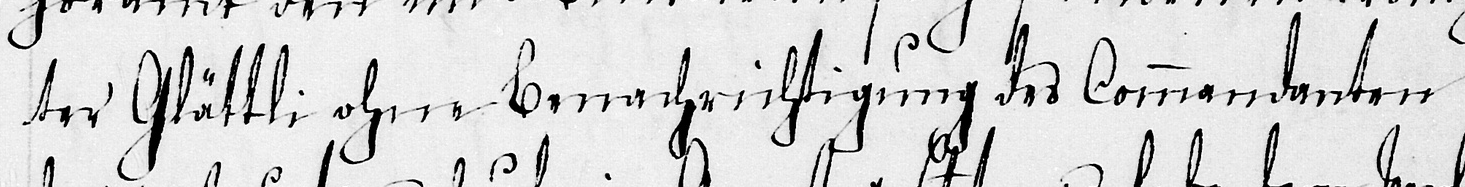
ter Glättli ohne Benachrichtigung des Commandanten
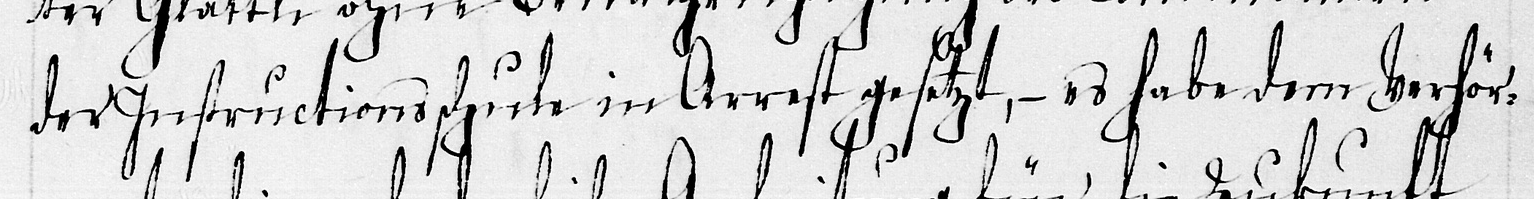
der Instructionsschule in Arrest gesetzt, – es habe dem Verhör¬
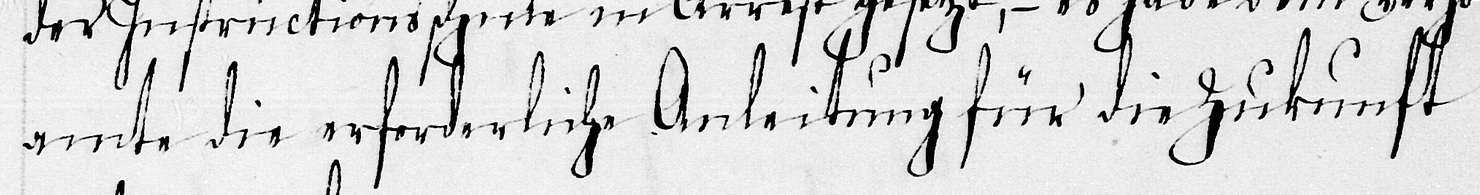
amte die erforderliche Anleitung für die Zukunft
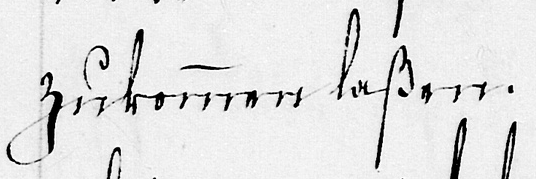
zukommen laßen.
